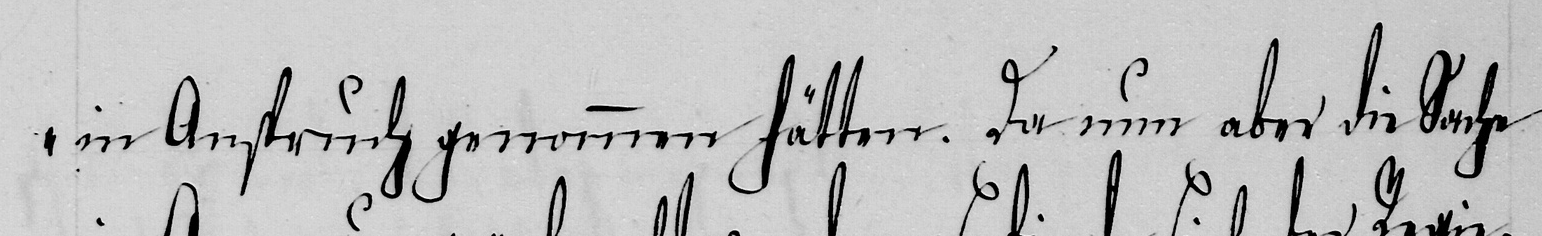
in Anspruch genommen hätten. Da nun aber die Sache
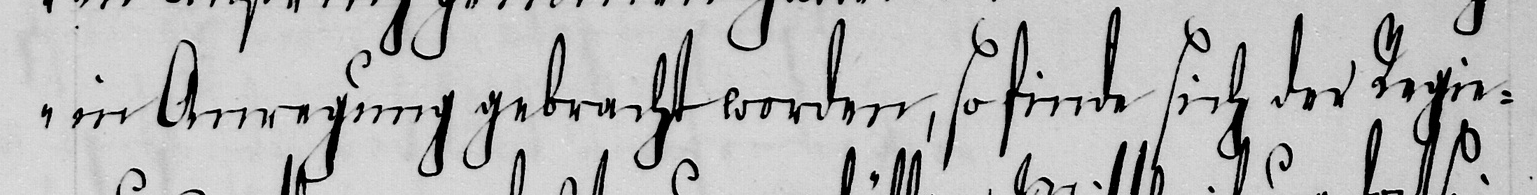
in Anregung gebracht worden, so finde sich der Regi¬
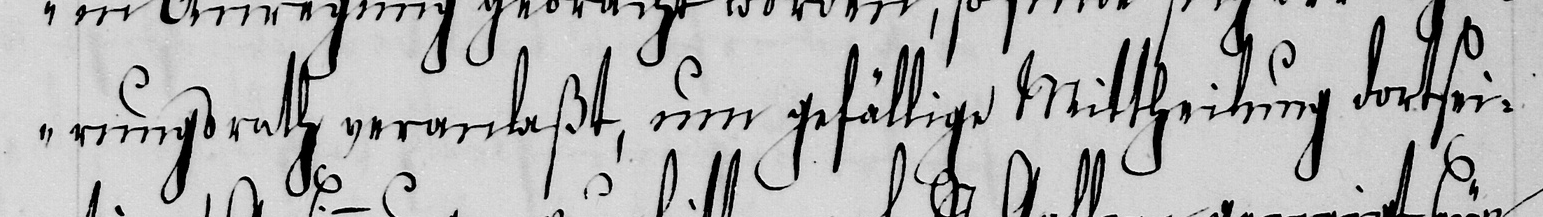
erungsrath veranlaßt, um gefällige Mittheilung dortsei¬
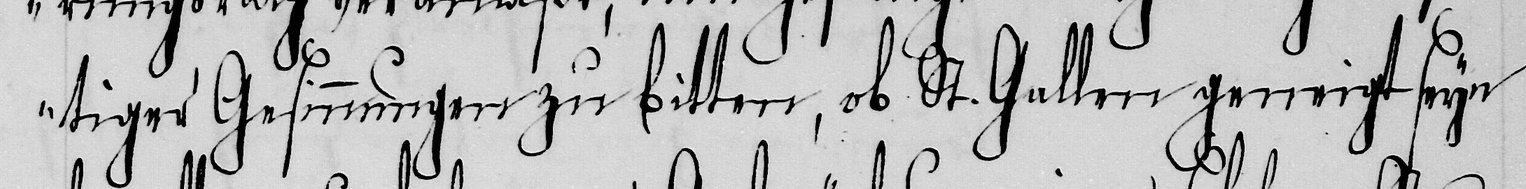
tiger Gesinnungen zu bitten, ob St. Gallen geneigt seyn
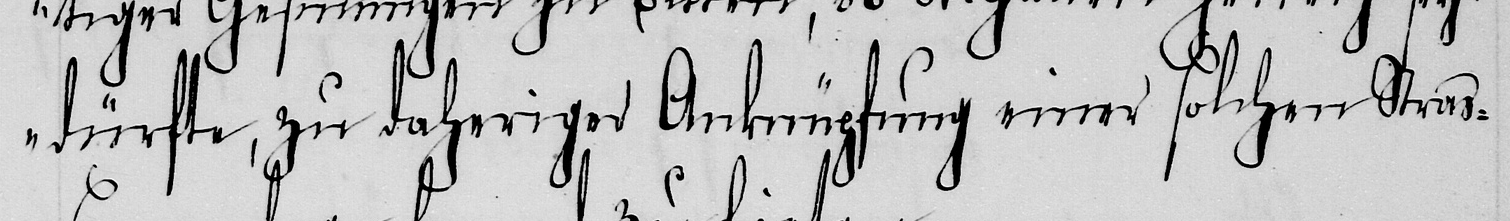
dürfte, zu daheriger Anknüpfung einer solchen Straß¬
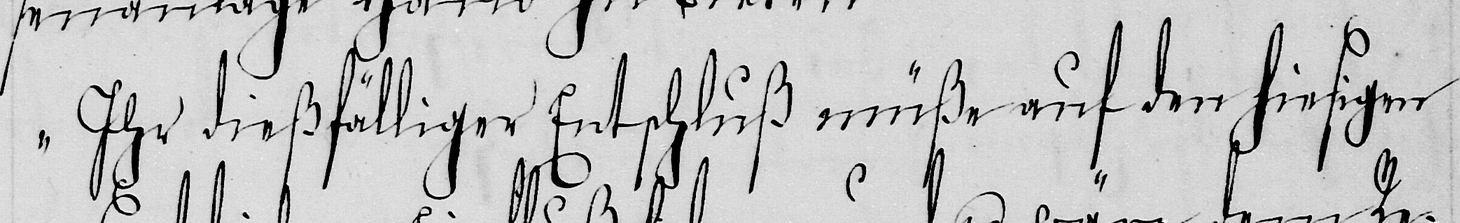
Ihr dießfälliger Entschluß müße auf den hiesigen
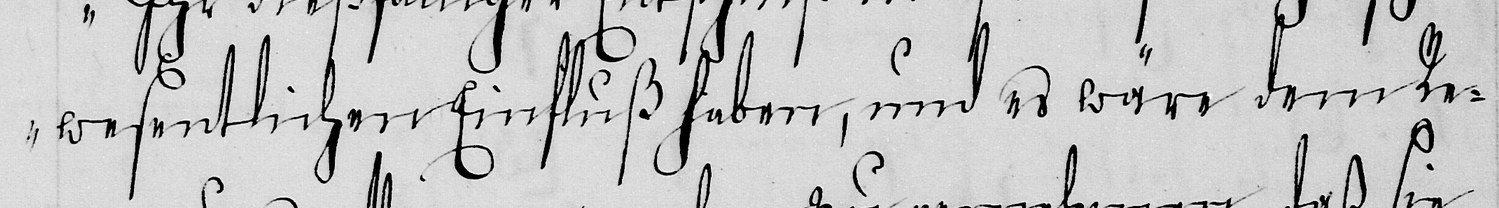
wesentlichen Einfluß haben, und es wäre dem Re¬
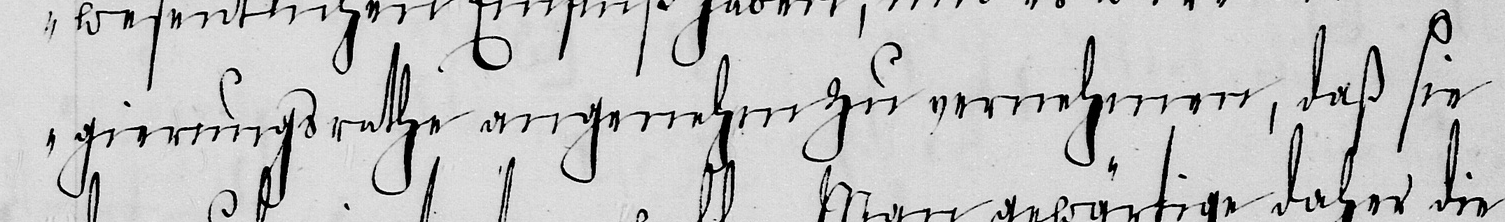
gierungsrathe angenehm zu vernehmen, daß sie
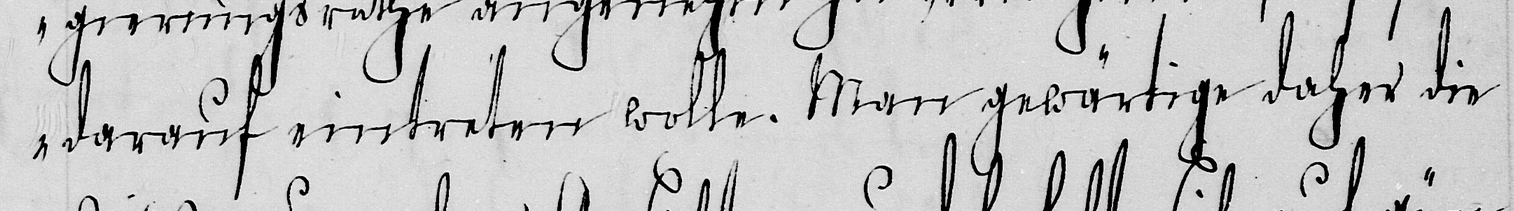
darauf eintreten wolle. Man gewärtige daher die
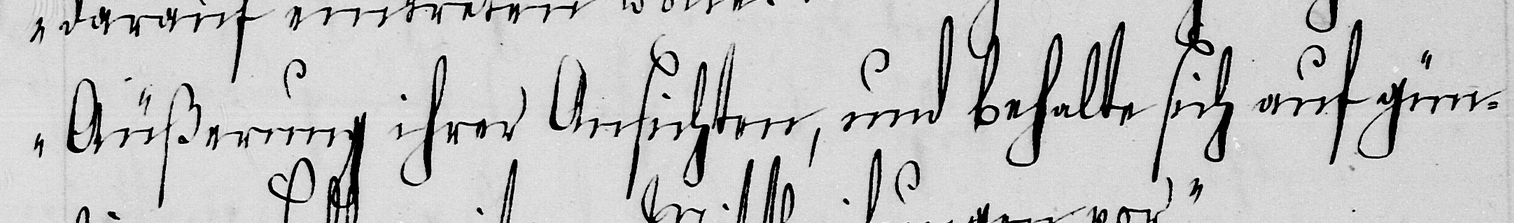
Äußerung ihrer Ansichten, und behalte sich auf gün¬
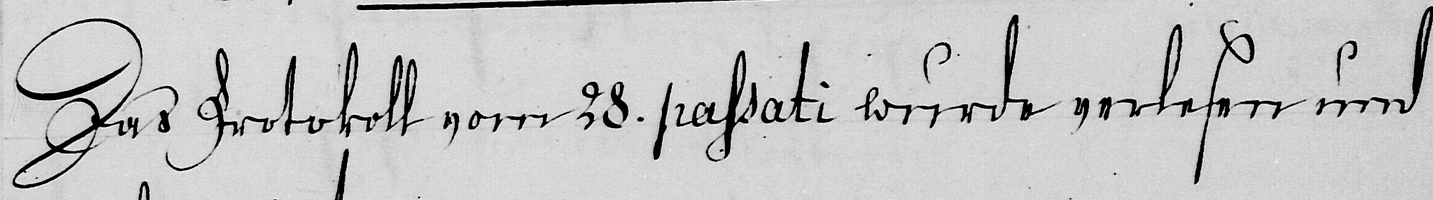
Das Protokoll vom 28. passati wurde verlesen und
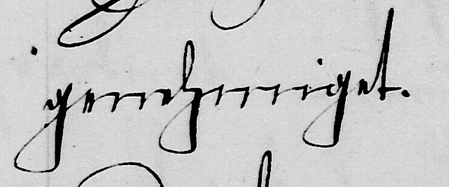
genehmiget.
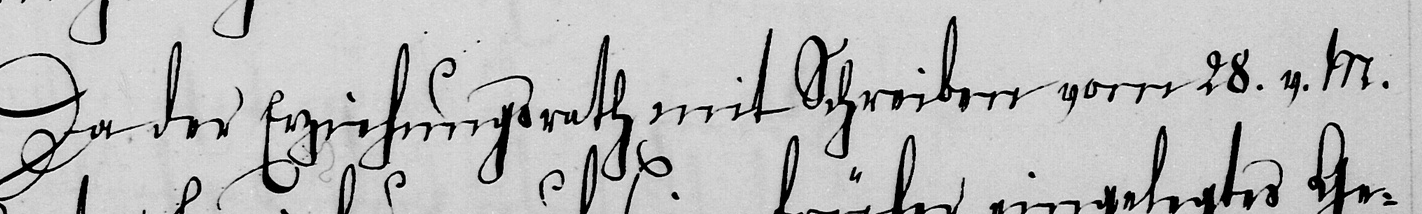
Da der Erziehungsrath mit Schreiben vom 28. v. M.
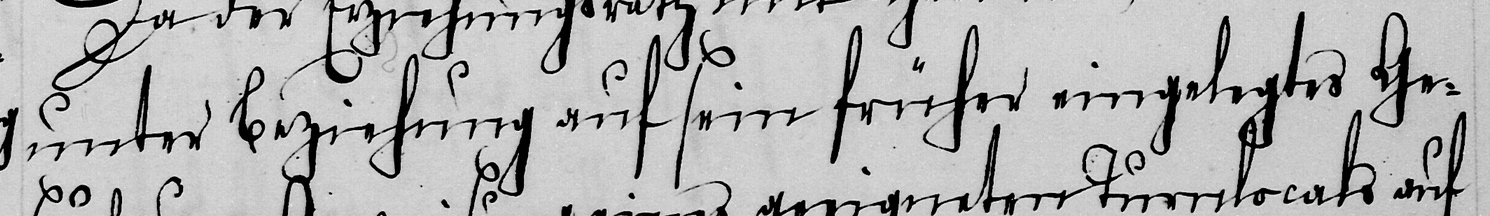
unter Beziehung auf sein früher eingelegtes Ge¬
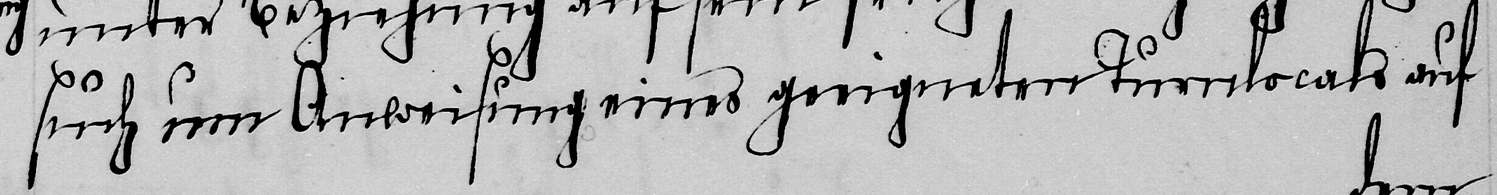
such um Anweisung eines geeigneten Turnlocals auf
